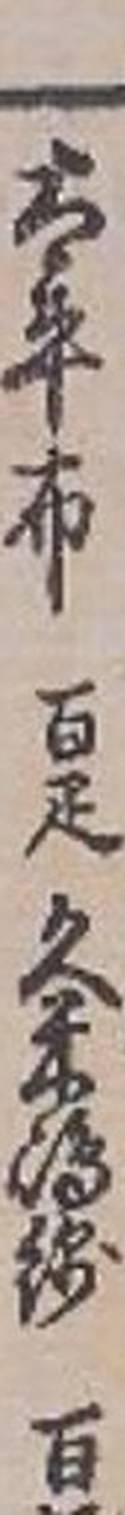太平布百疋久米嶋綿百把
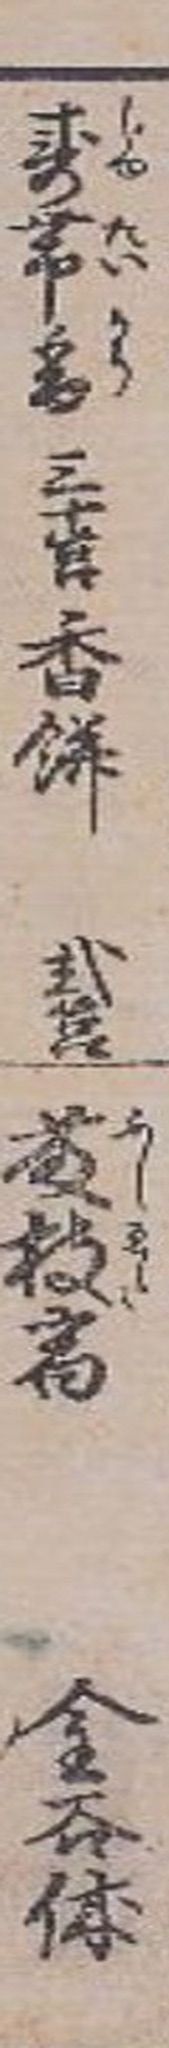寿帯香三十袋香餅弐箱

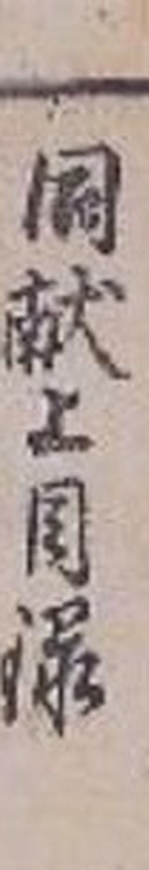同献上目録
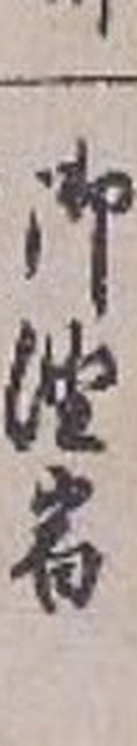御油宿
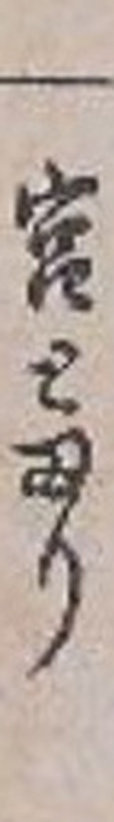宮とまり
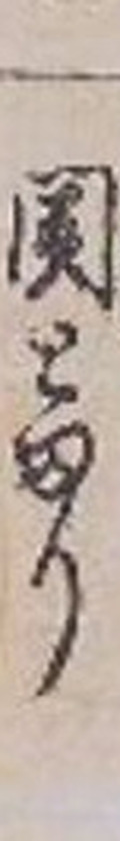関とまり
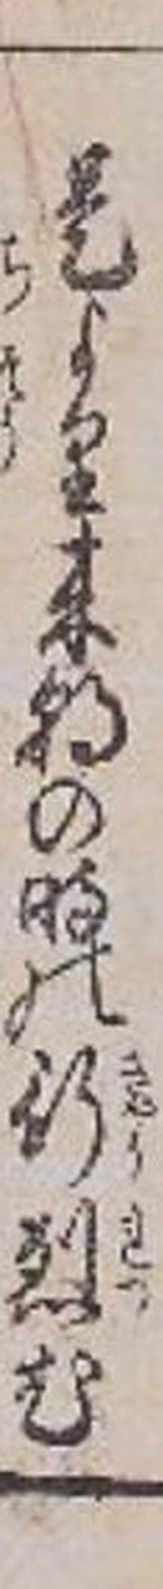是より来朝の時の行烈ひ
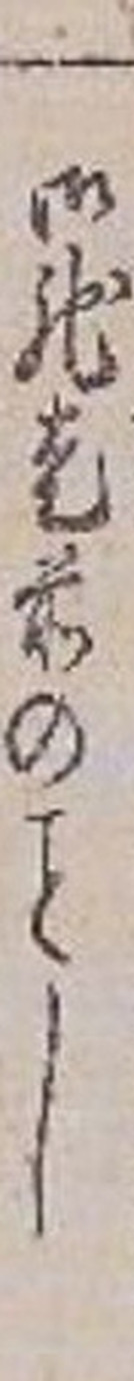御馳走前のことし
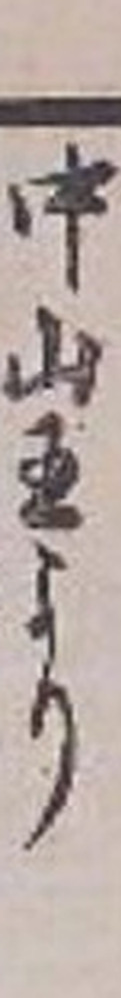中山王より
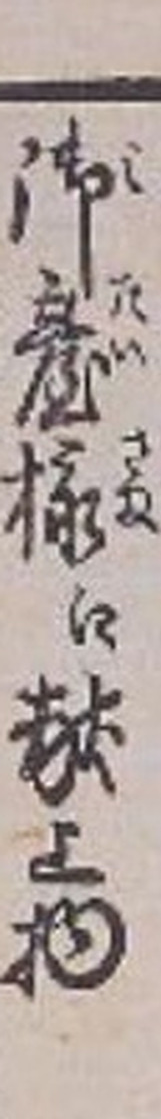御臺様え献上物
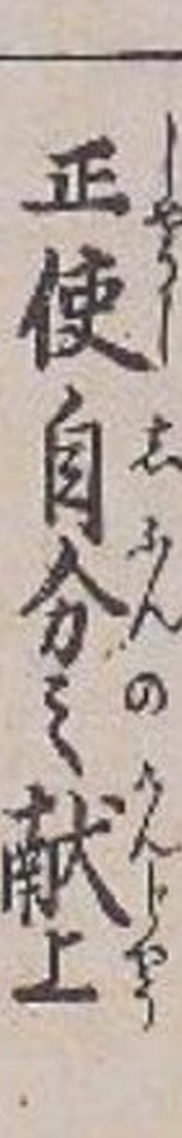正使自分之献上
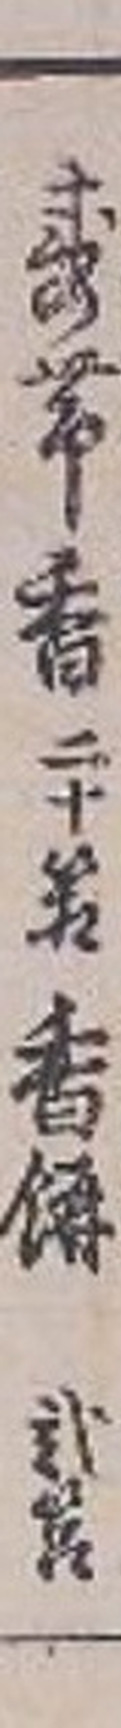寿帯香二十箱香餅弐箱
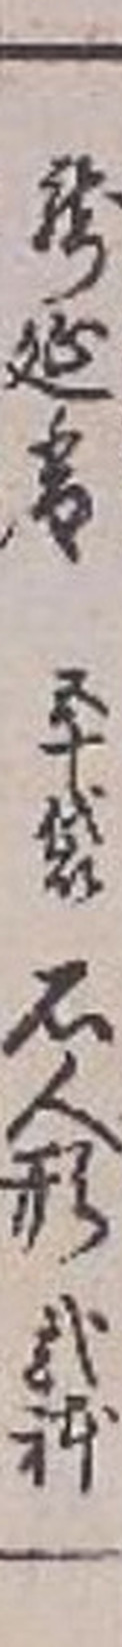龍涎香五十袋石人形弐躰
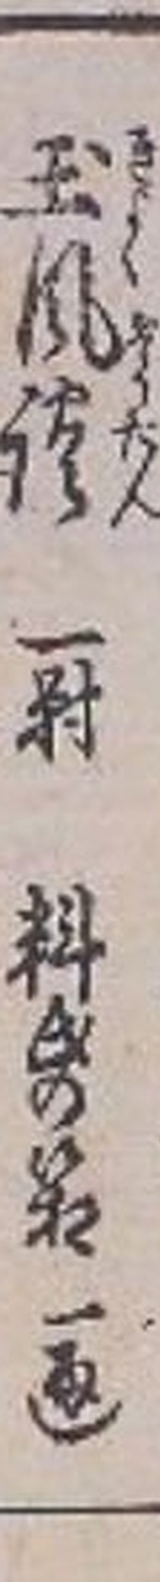玉風談一對料氏の箱一通

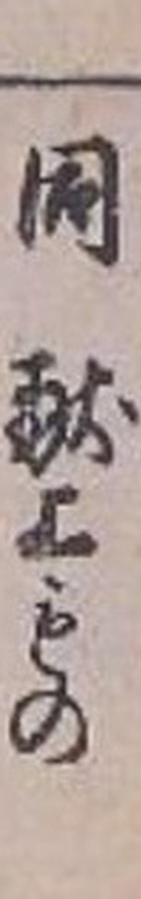同献上もの
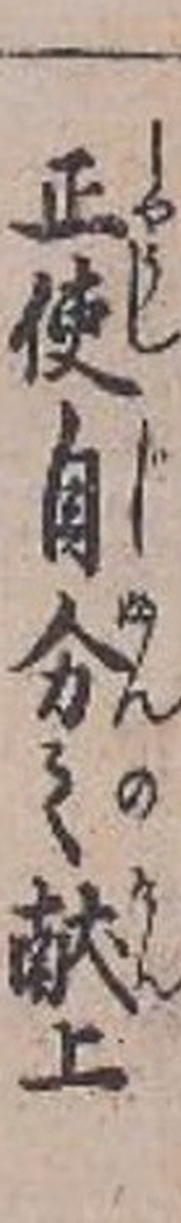正使自分之献上
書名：琉球人大行列記 大全 来朝新板絵入
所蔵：University of the Ryukyus Library
